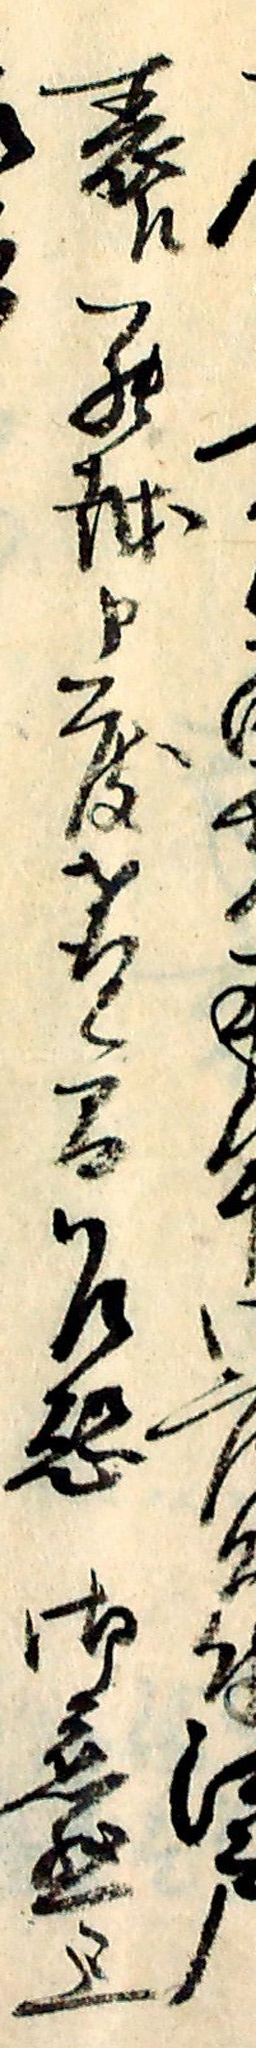表え罷越申度奉存候間乍恐御慈悲之上
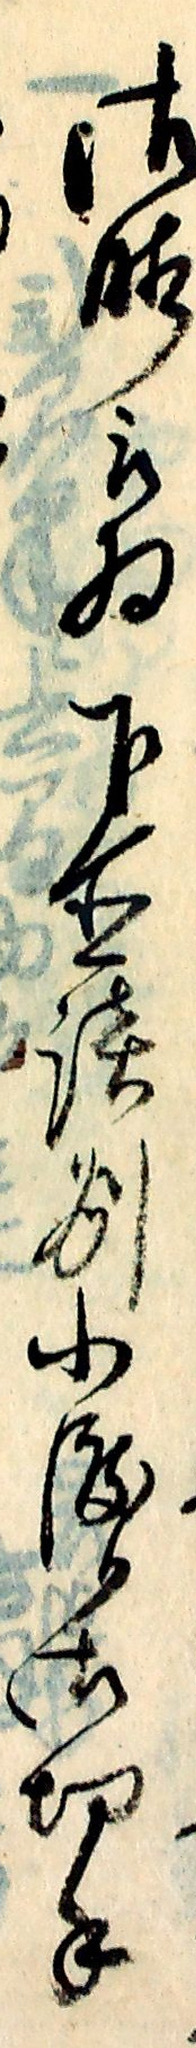御暇被為下置淡州小渡り御切手
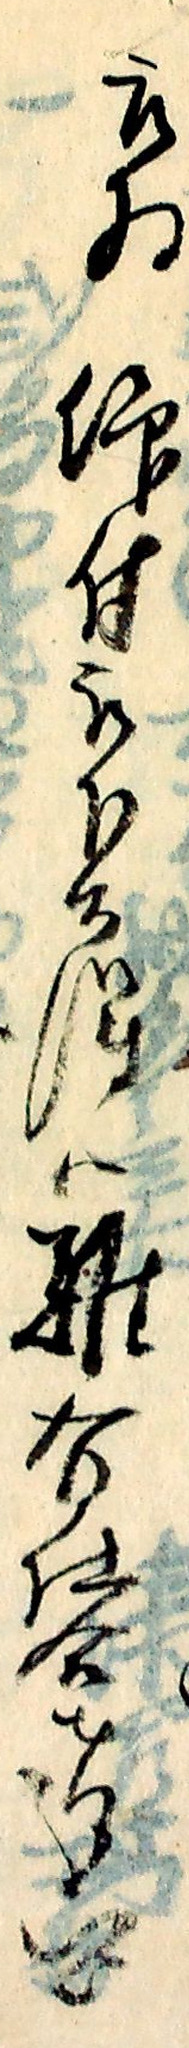被為仰付被下候得は難有仕合奉存候以上
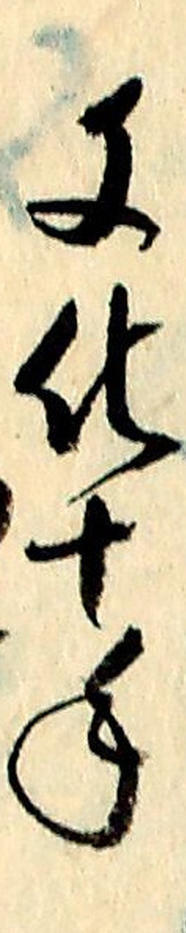文化十年
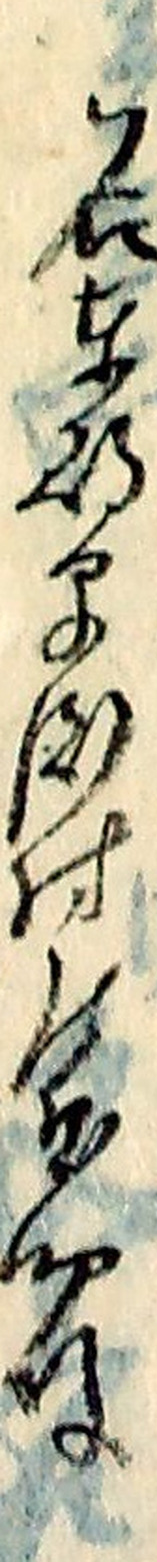名東郡早淵村庄屋助役
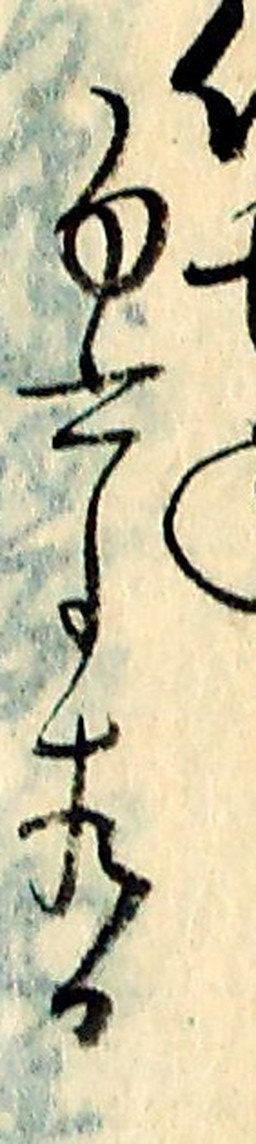酉六月十九日
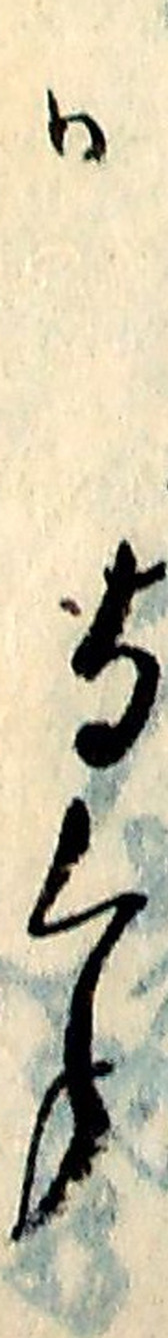与三郎
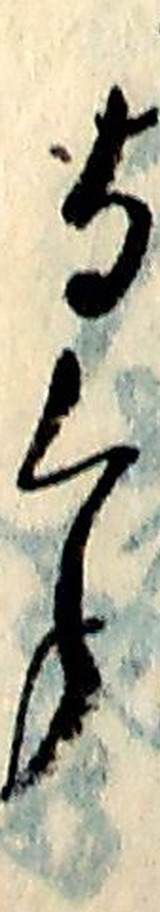与三郎
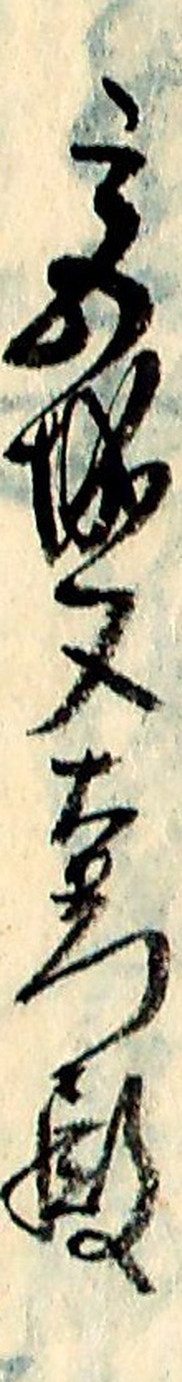宮城文右衛門殿同

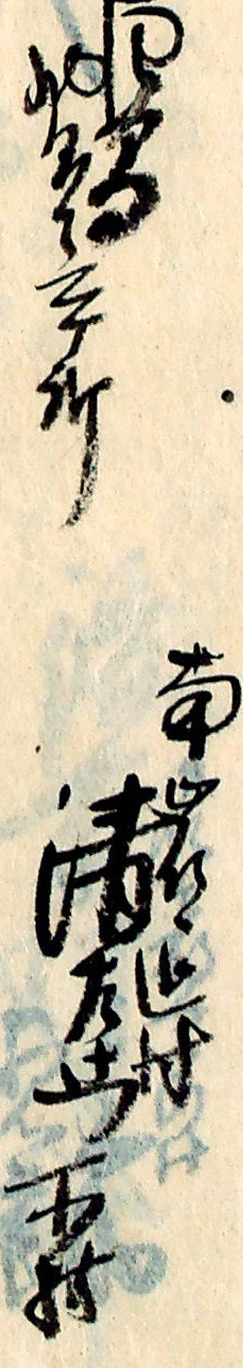納屋壱ヶ所清左衛門所持
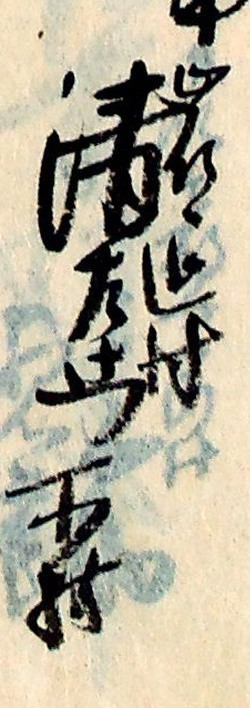清左衛門所持
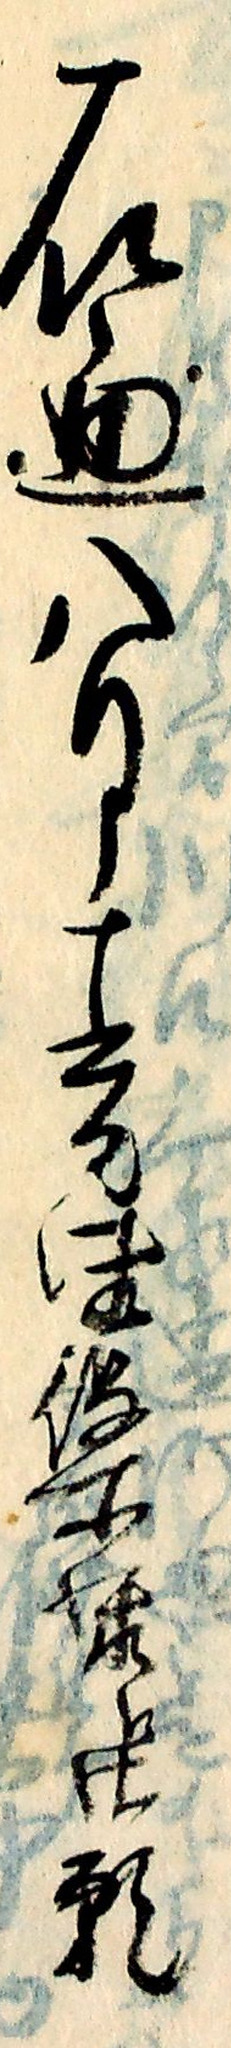右之通八月十六日御役所様え御願
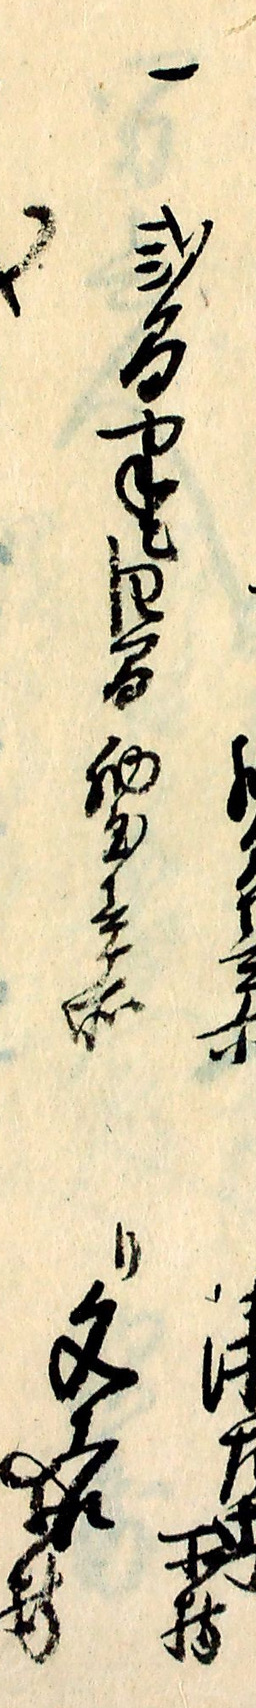一弐間半に四間納屋壱ヶ所和田村
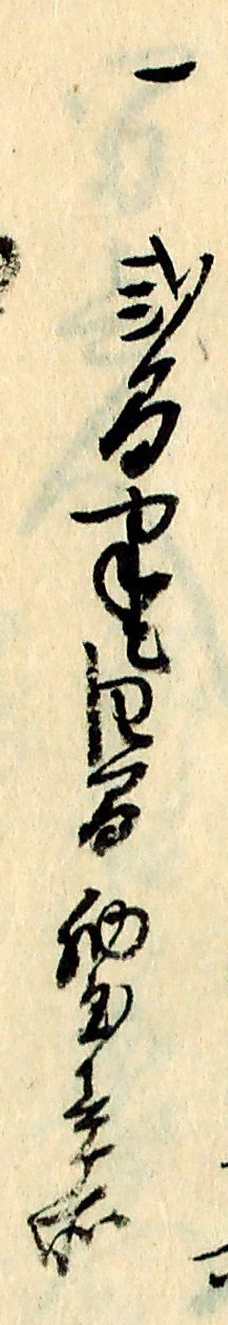一弐間半に四間納屋壱ヶ所同
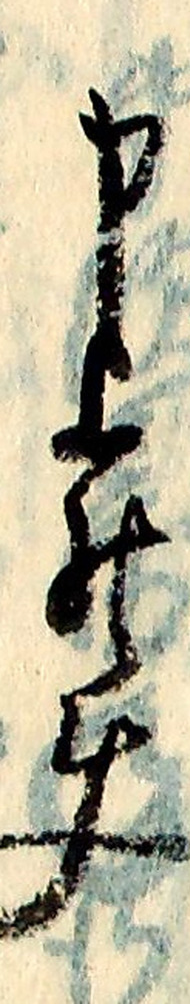申上候使
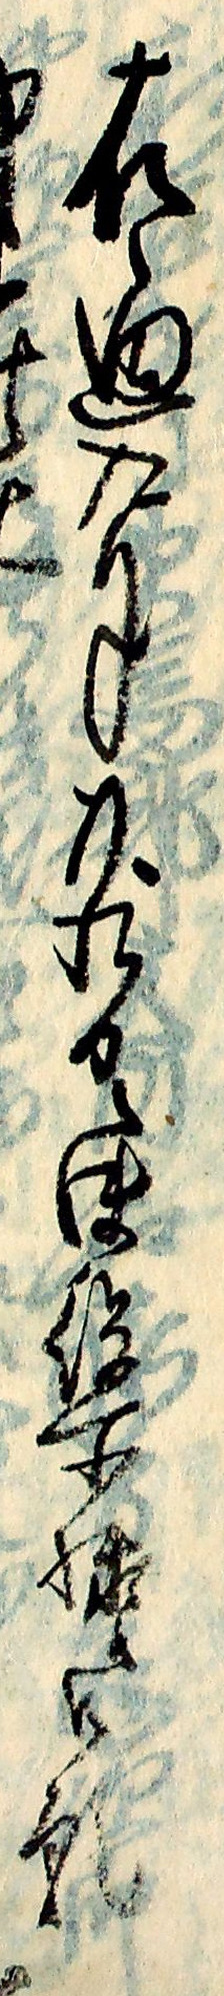右之通九月廿九日に御役所様え御願
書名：諸御願書控(後藤氏壱番）
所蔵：鳴門教育大学 Naruto University of Education
